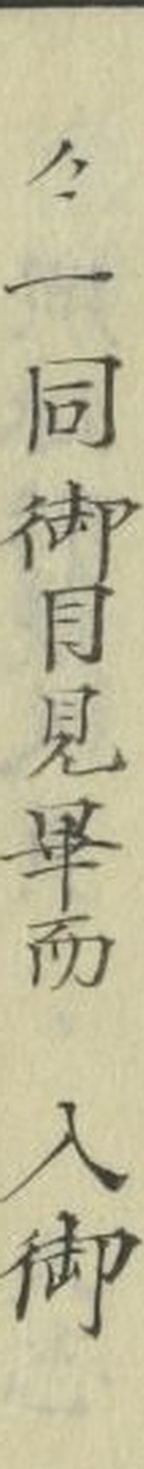々一同御目見畢而入御
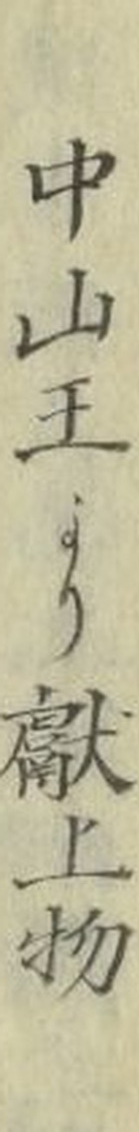中山王より献上物
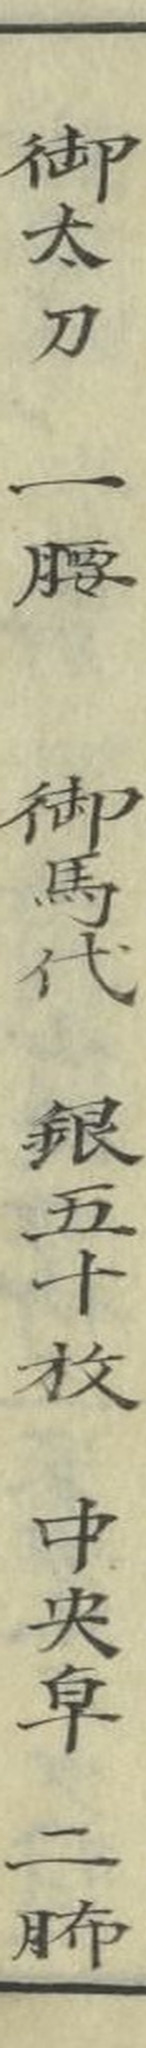御太刀一腰御馬代銀五十枚中央卓二
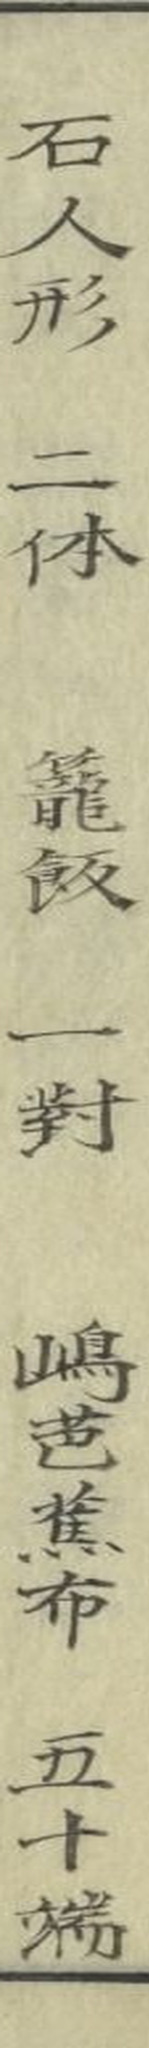石人形二体籠飯一対嶋芭蕉布五十端
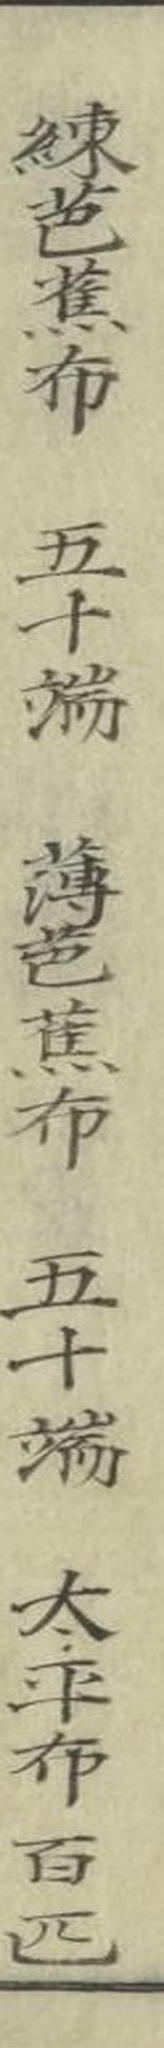練芭蕉布五十端薄芭蕉布五十端太平布百匹
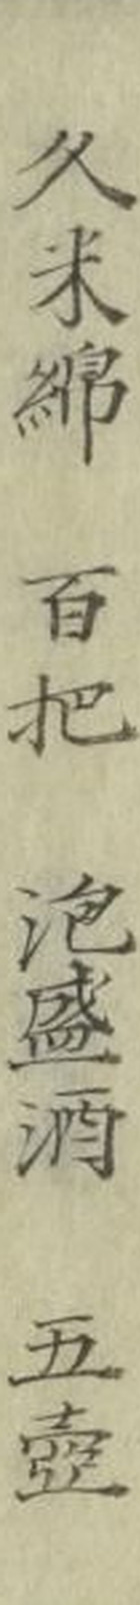久米綿百把泡盛酒五壺

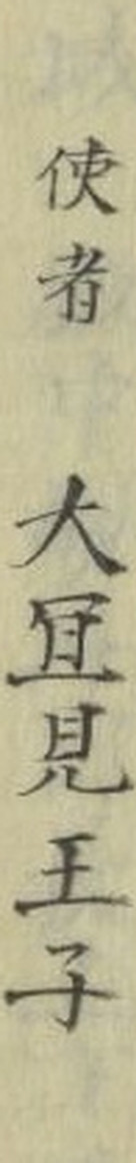使者大宜見王子
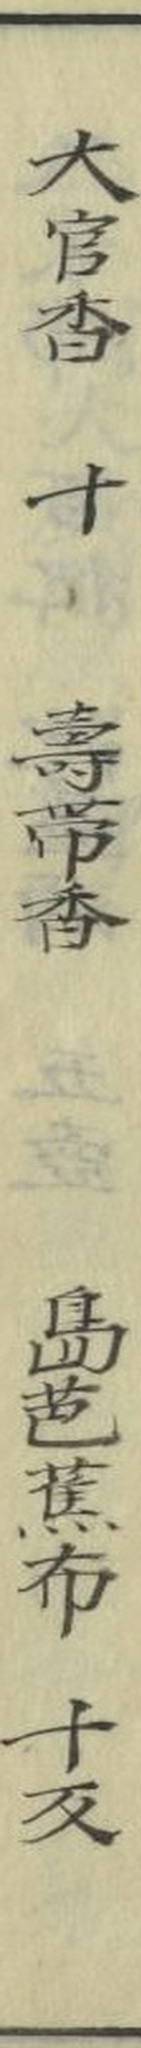大官香十寿帯香島芭蕉布十反
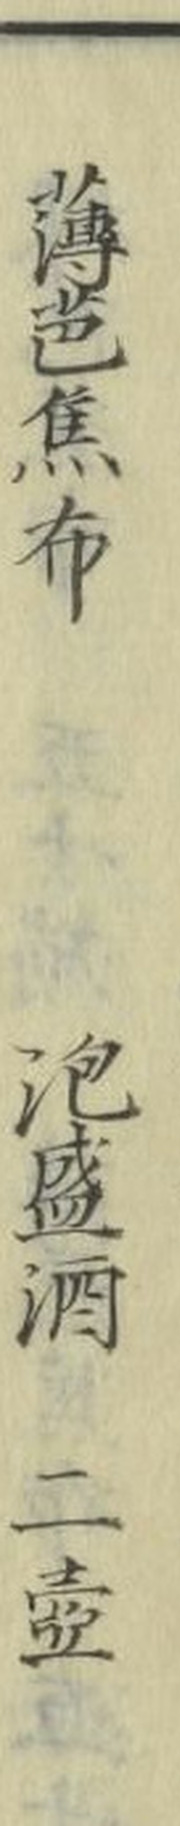薄芭蕉布泡盛酒二壺
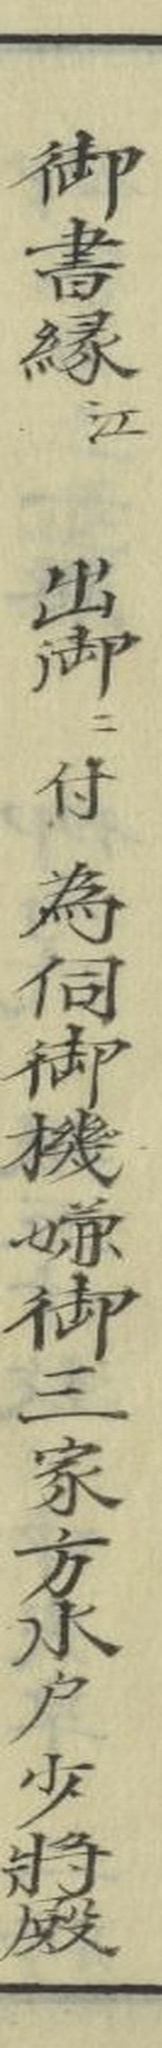御書縁江出御ニ付為伺御機嫌御三家方水戸少将殿
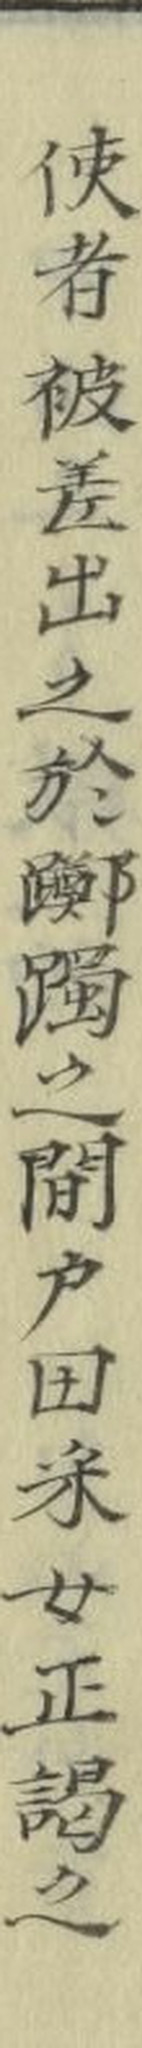使者被差出之於躑躅之間戸田采女正謁之
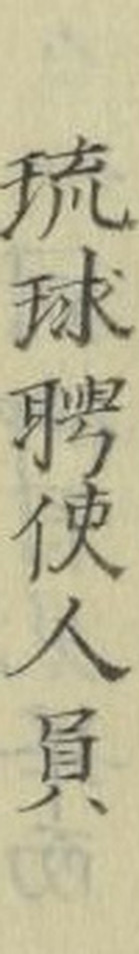琉球聘使人員
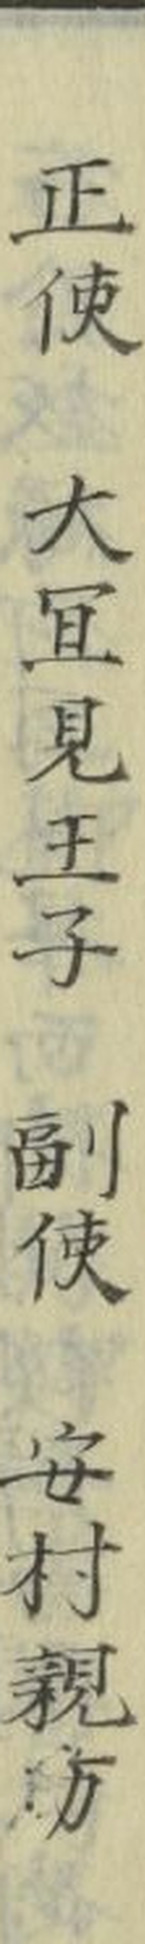正使大宜見王子副使安村親方
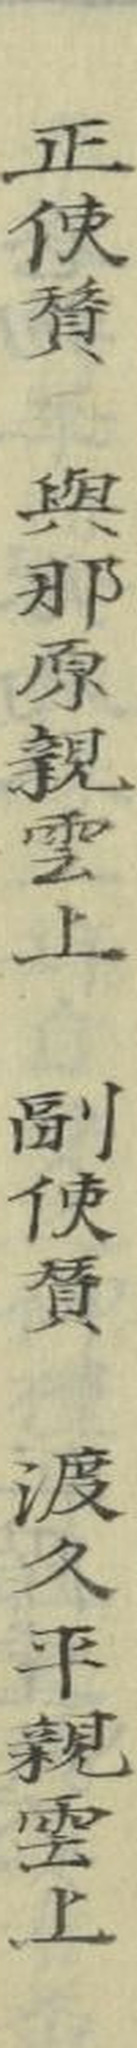正使賛與那原親雲上副使賛渡久平親雲上
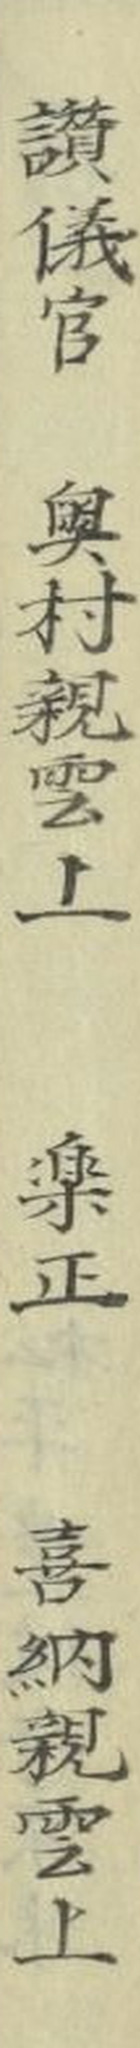讃儀官奥村親雲上楽正喜納親雲上
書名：琉球沿革志 下
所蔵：University of the Ryukyus Library
